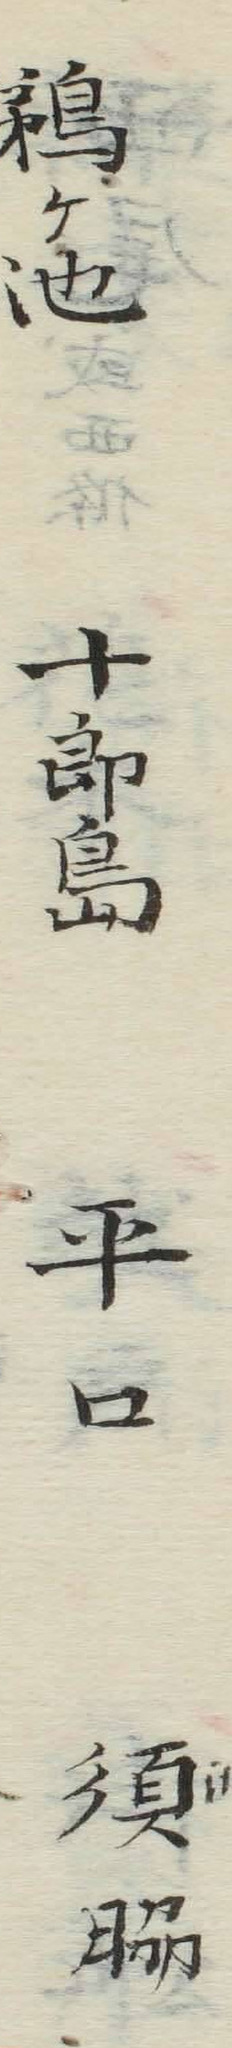鵜ケ池十郎島平口須脇

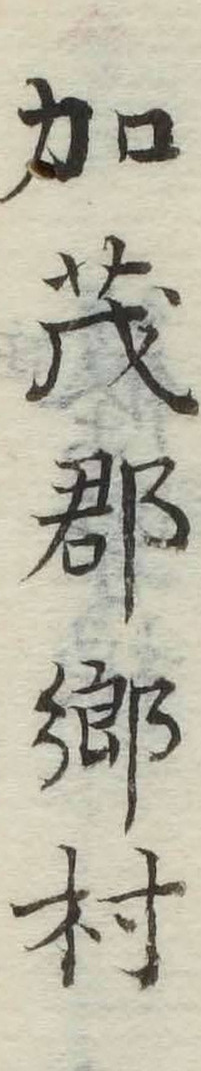加茂郡郷村
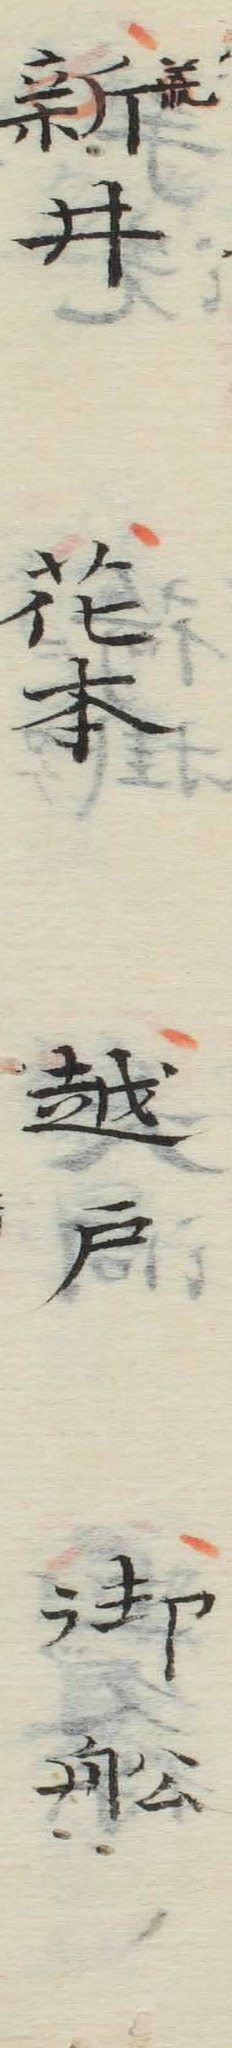新井花本越戸御舩

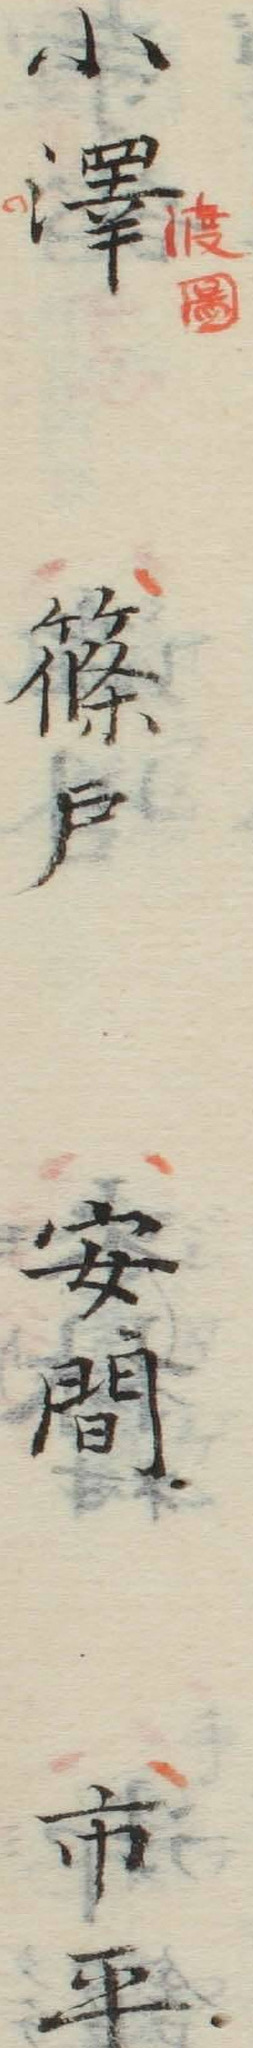苅萱篠戸安間市平

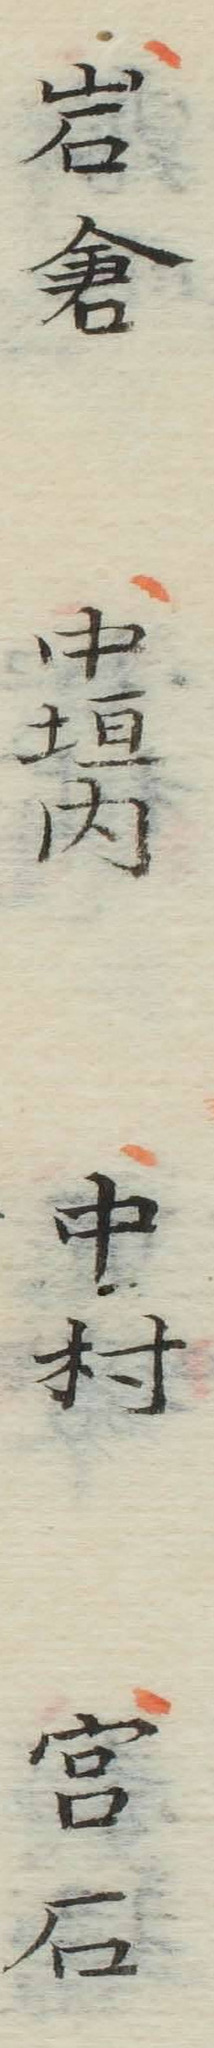岩倉中垣内中村宮石
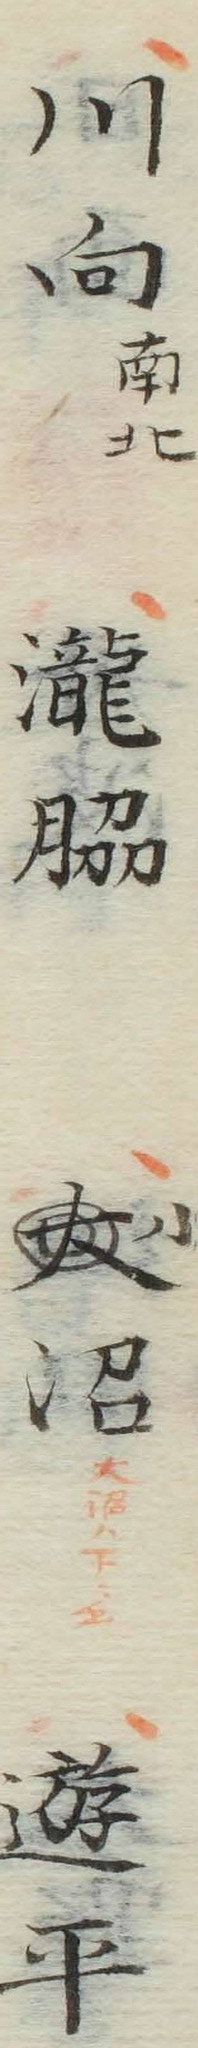川向南北瀧脇小沼遊平
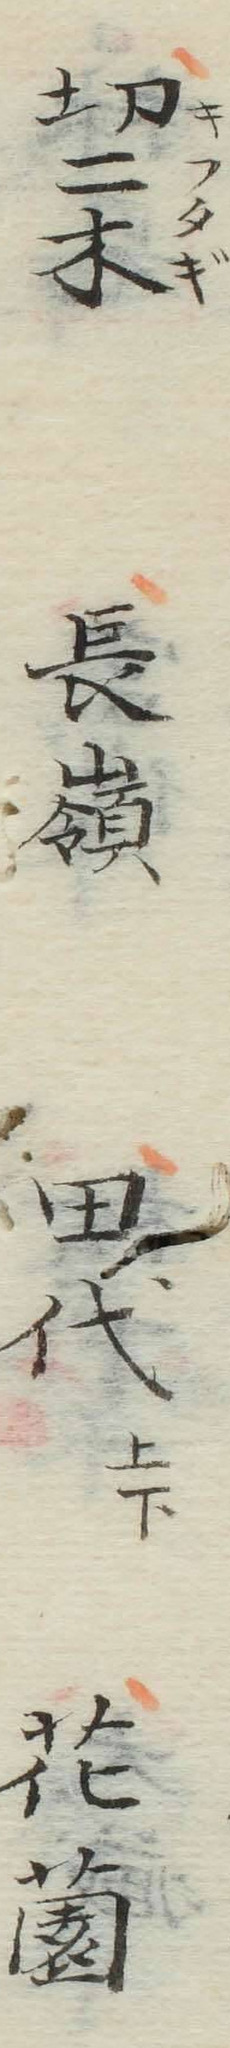切二木長嶺田代上下花薗
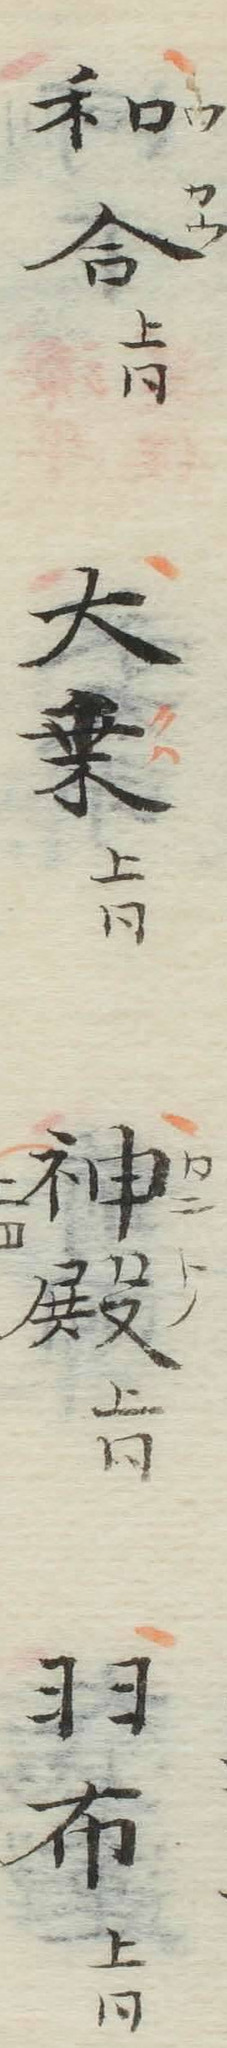和合上同大桒上同神殿上同羽布上同
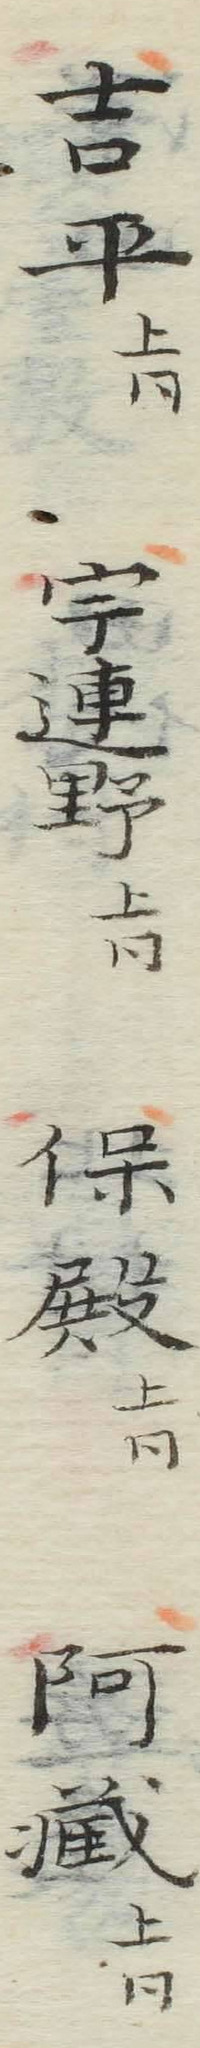吉平上同宇連野上同保殿上同阿藏上同
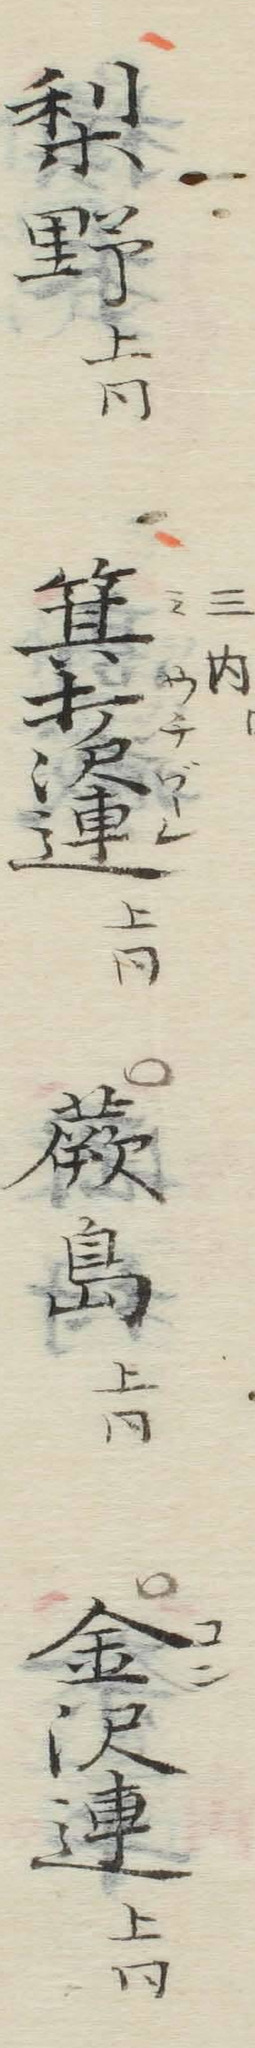梨野上同箕打沢連上同○蕨島上同○金沢連上同
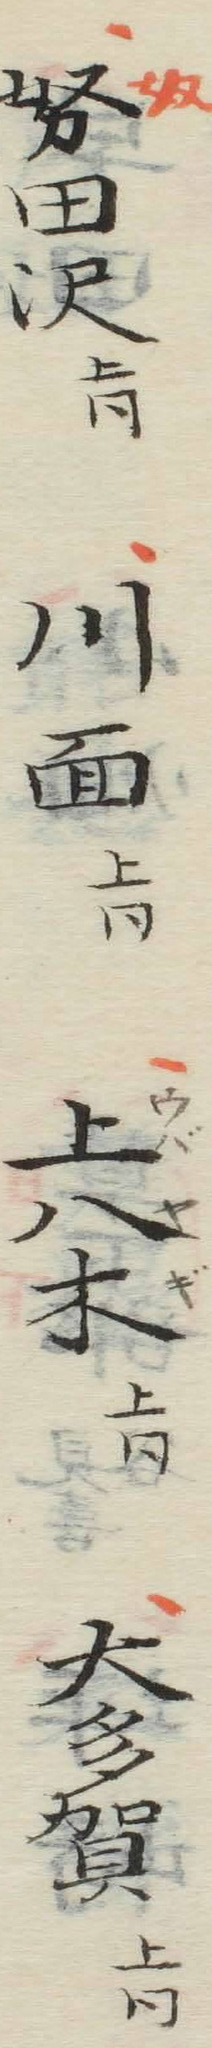努田沢上同川面上同上八木上同大多賀上同
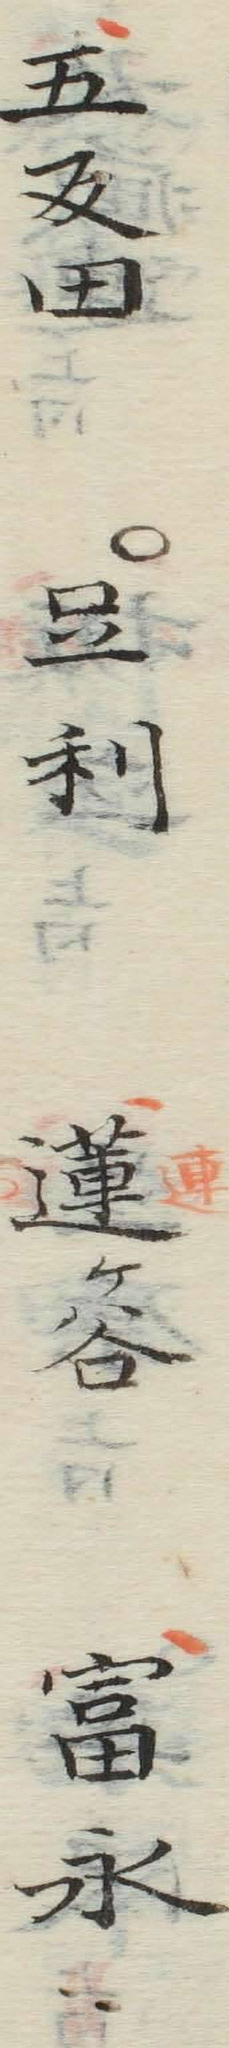五反田○足利蓮ケ谷富永
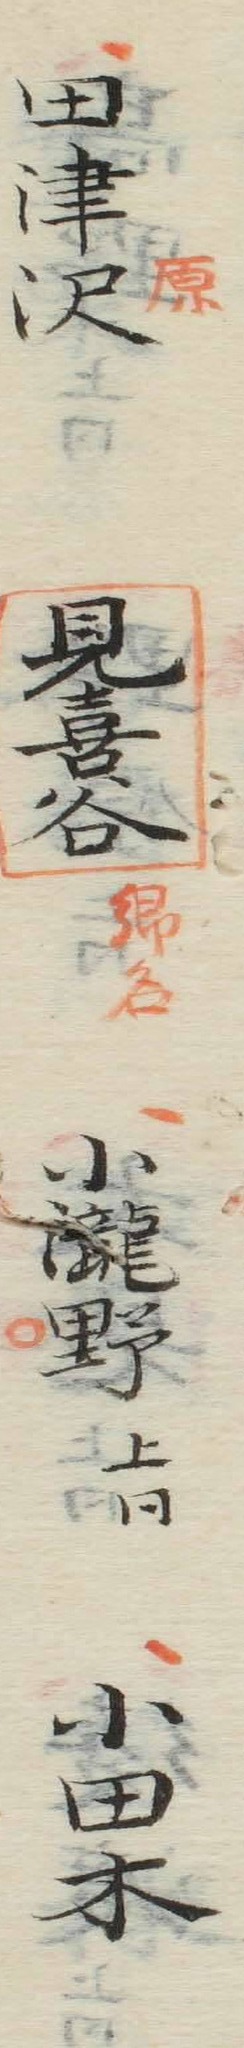田津沢原見喜谷小瀧野上同小田木
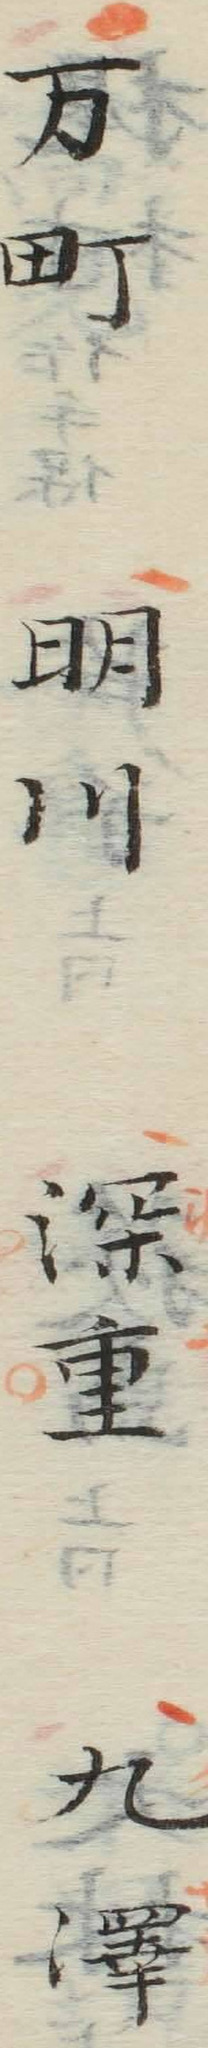万町明川深重九澤
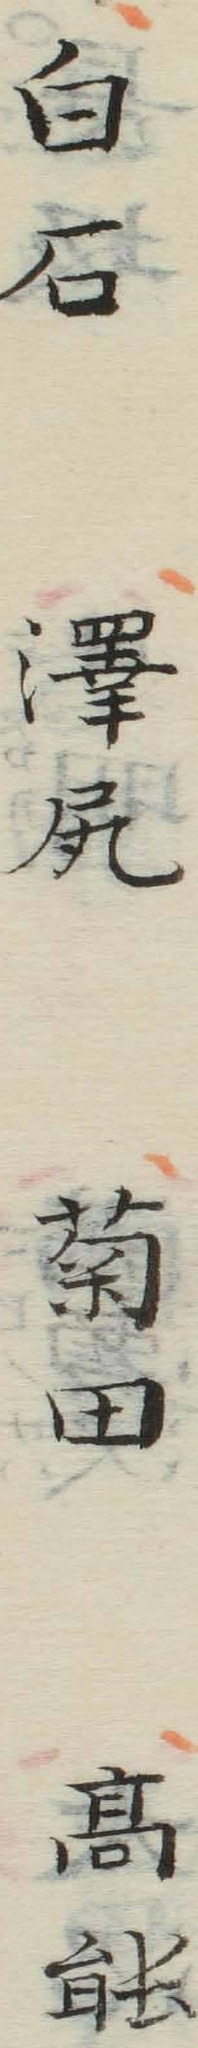白石澤尻菊田髙能
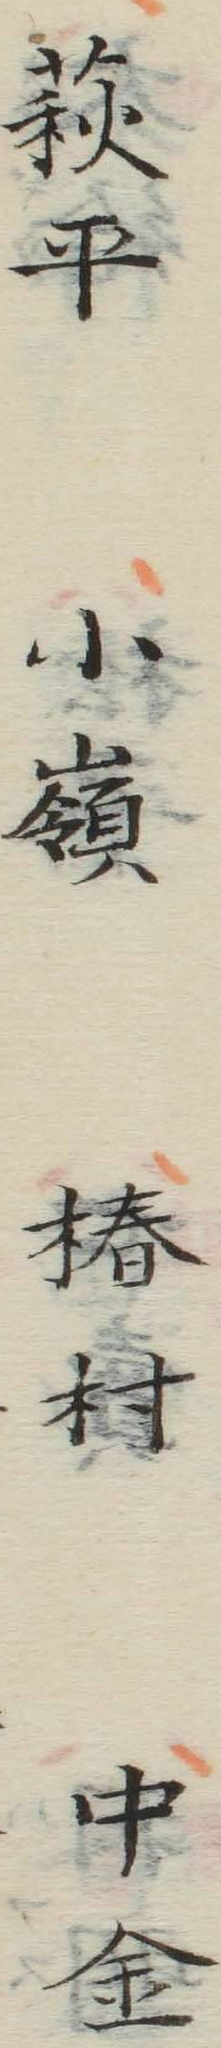萩平小嶺椿村中金
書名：三河国二葉松
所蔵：国文学研究資料館
